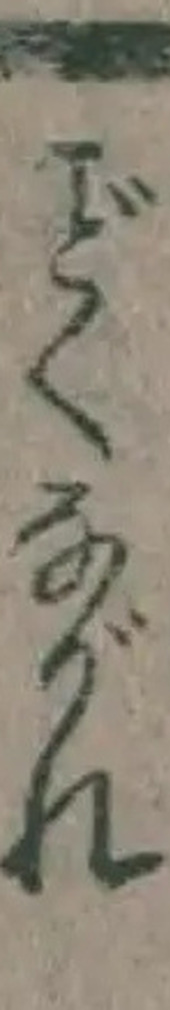ごとくながれ
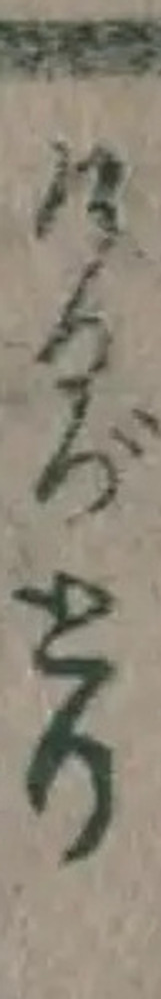けるがとり
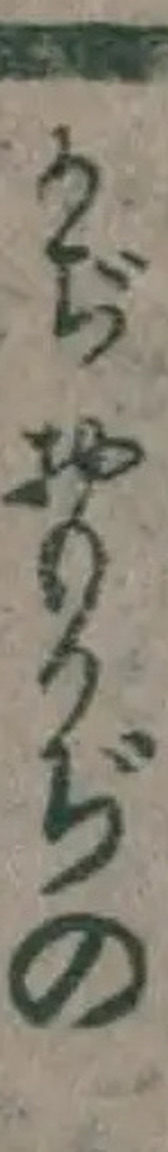かぢおもかぢの
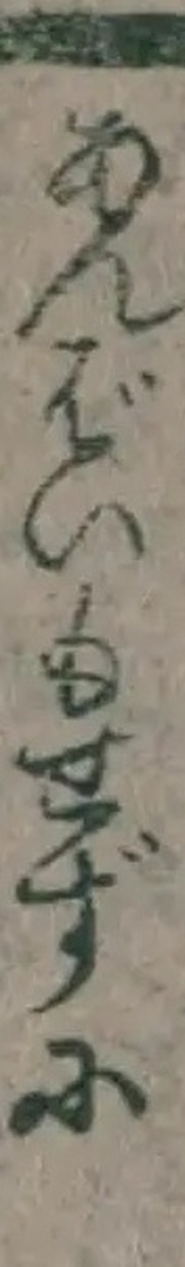あんばいもせずに
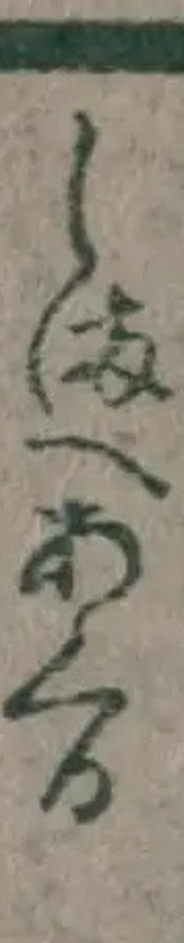しまへあくる
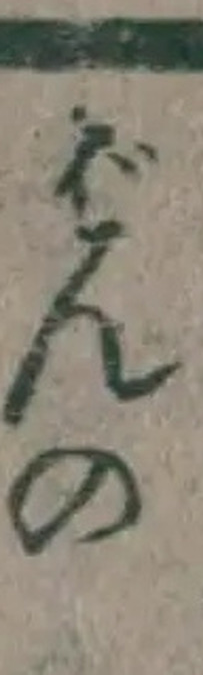ばんの
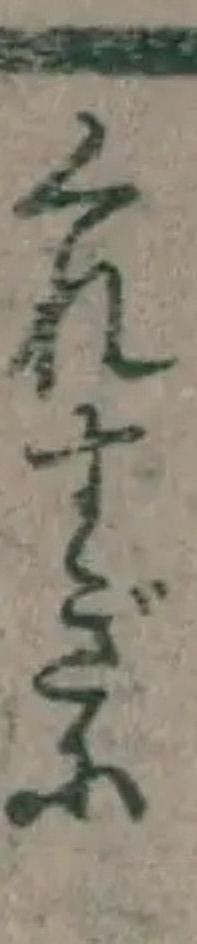くれすぎに
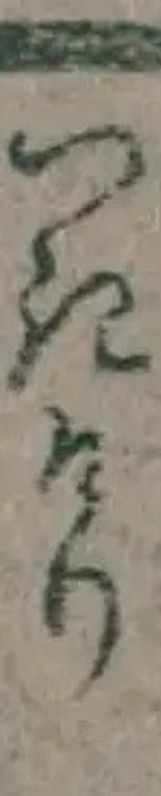つきけり
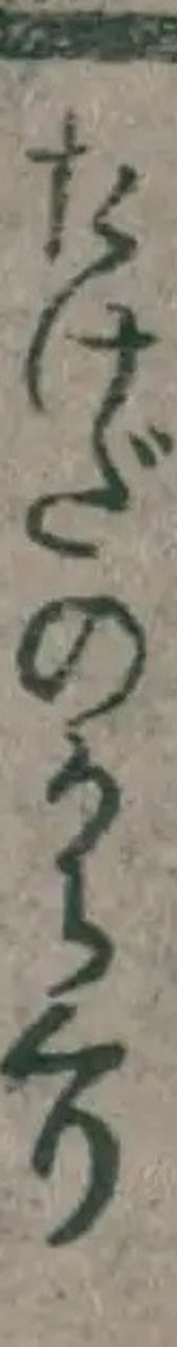たけだのからくり
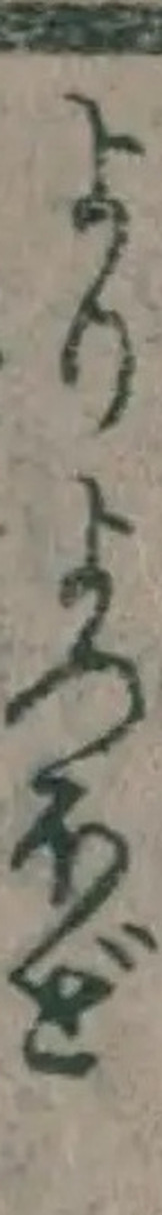よりよつほど
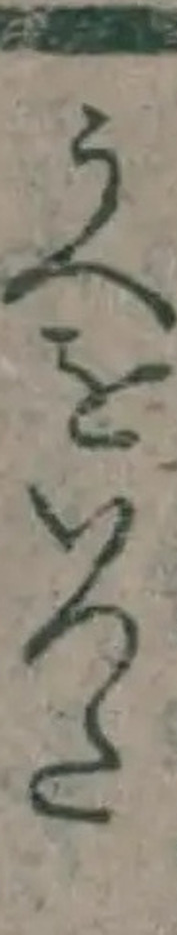うへをいつた
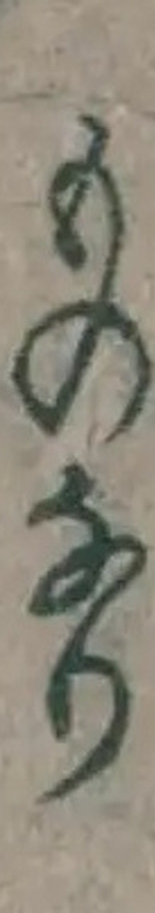ものなり

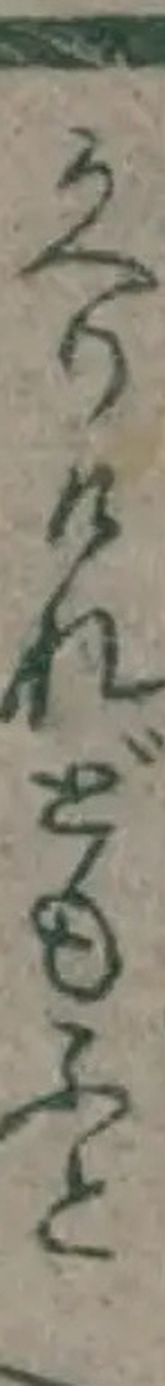かへりけれどもふと
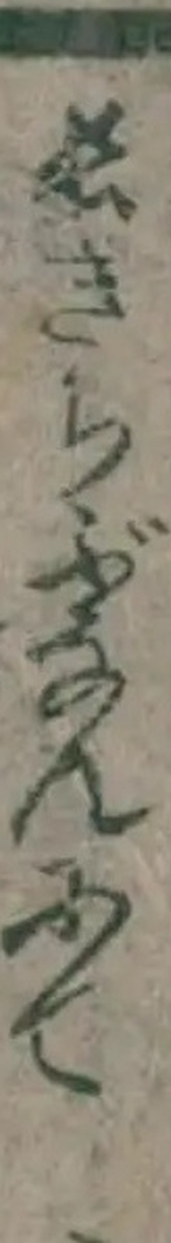長きちぶなんにて
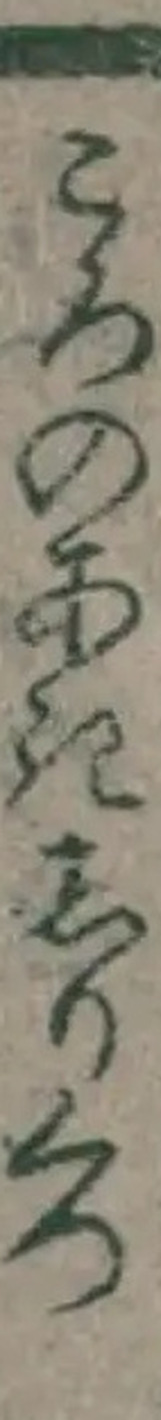こゝろのあきしりくつ
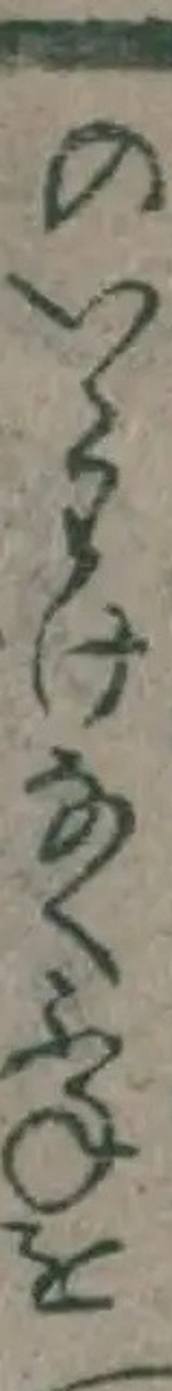のいゝわけなくふねを
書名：縦筒放唐の噺 3巻
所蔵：国立国会図書館 National Diet Library, JAPAN
